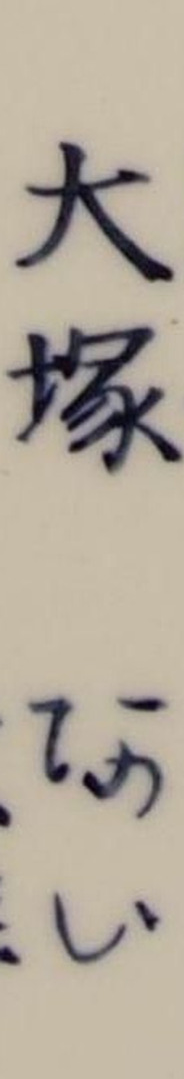大塚あい
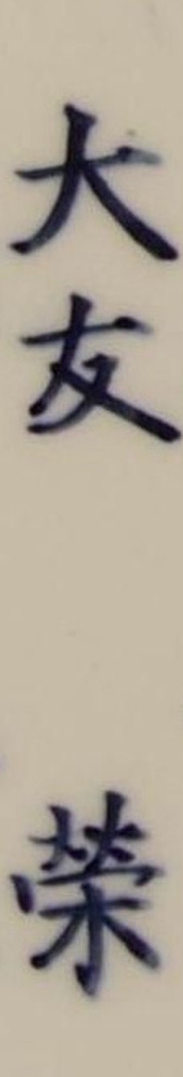大友榮
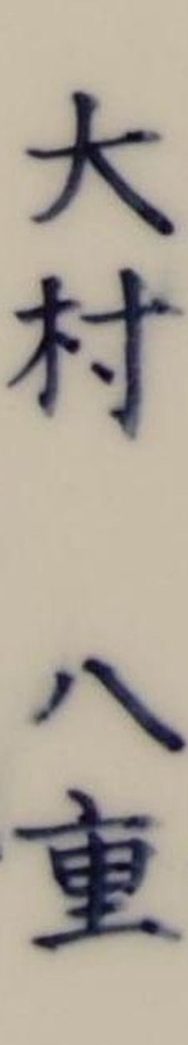大村八重
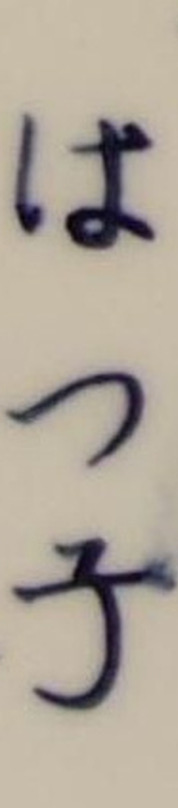はつ子
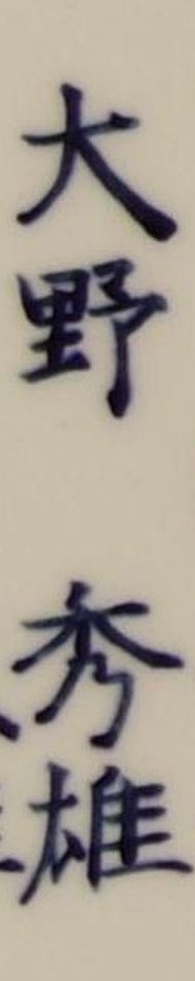大野秀雄
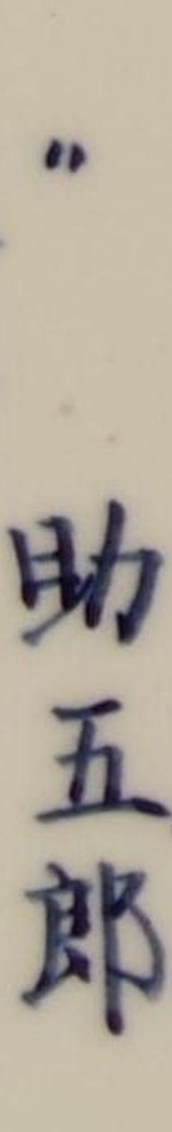助五郎
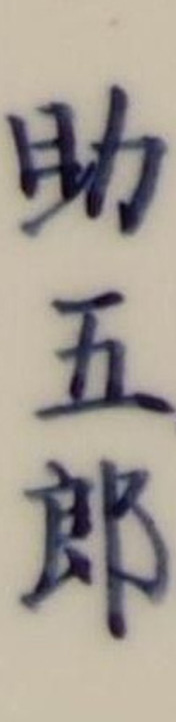助五郎
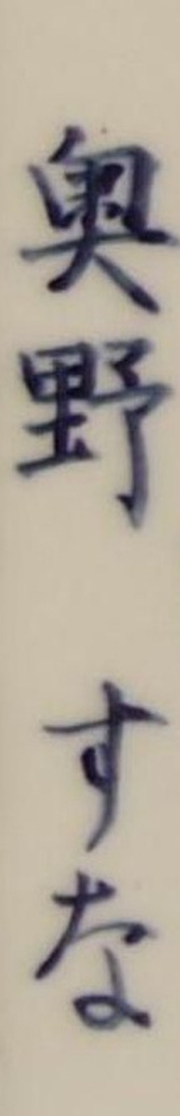奥野すな

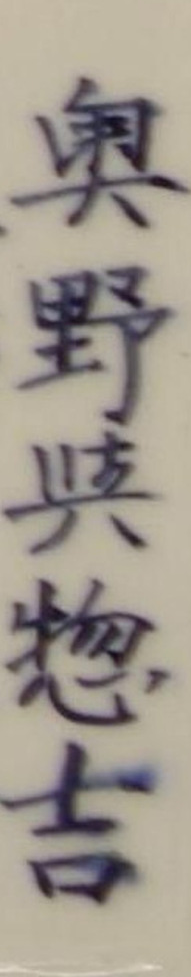奥野与惣吉
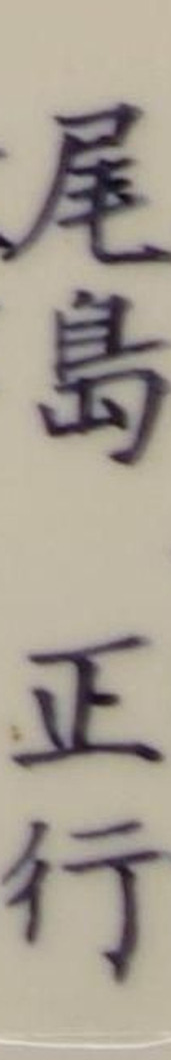尾島正行
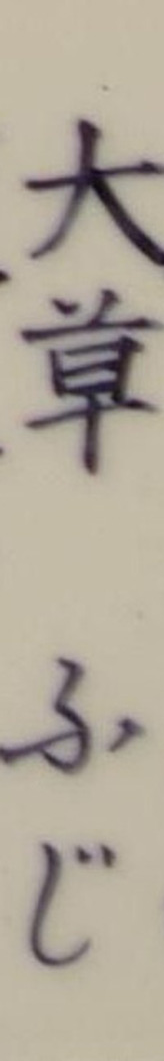大草ふじ
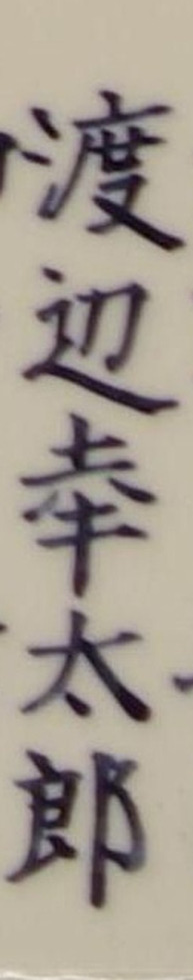渡辺幸太郎
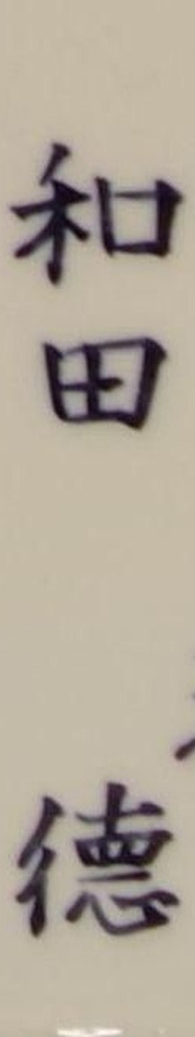和田徳
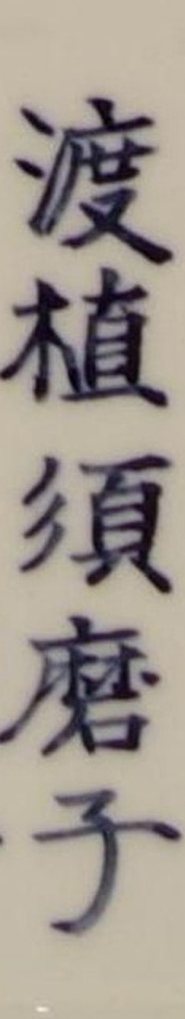渡植須磨子
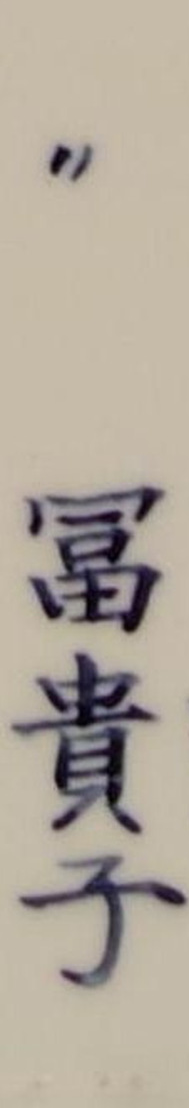冨貴子
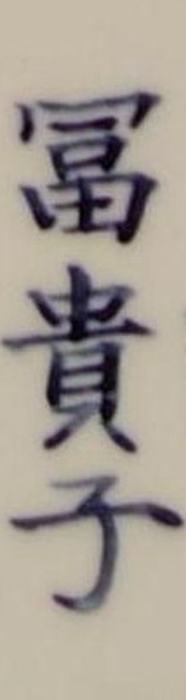冨貴子
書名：E~L
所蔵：高野山金剛峯寺
